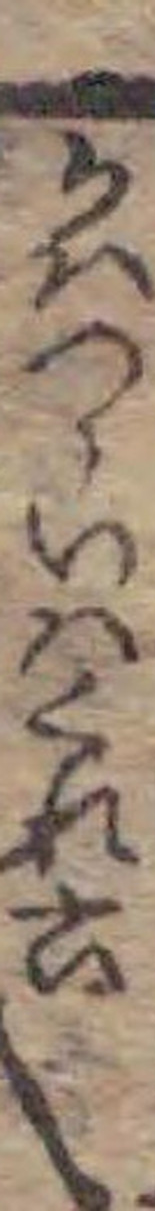かはつらいはくれ六
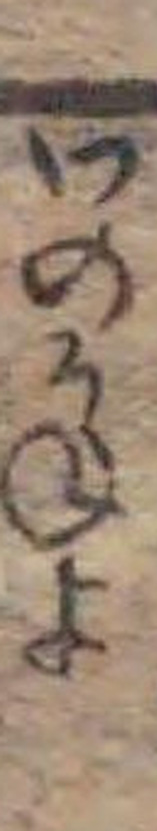つのかねよ
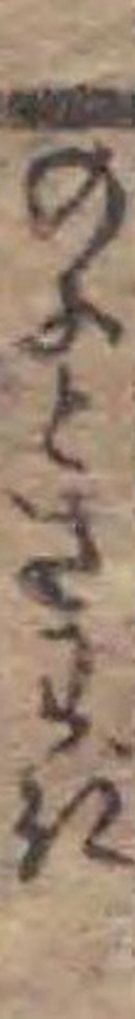のふとさわぎ
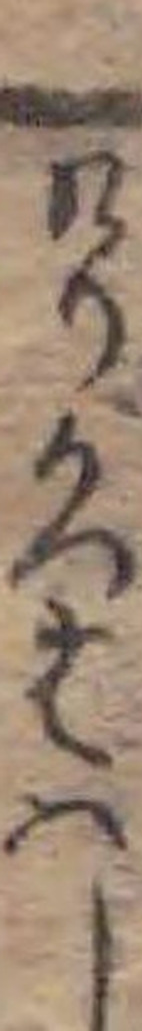けりかつは
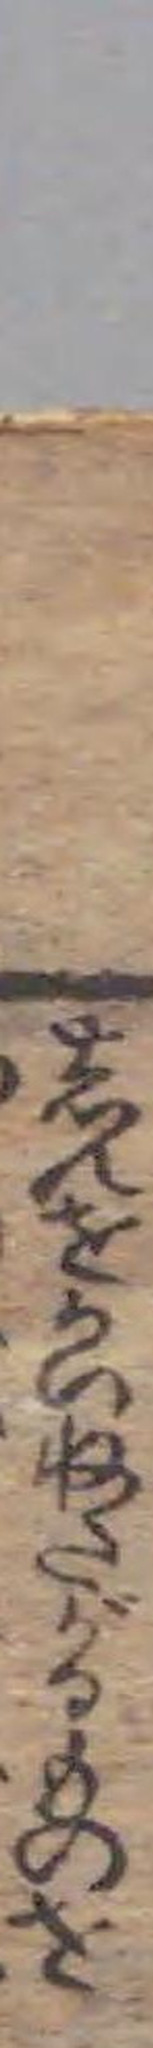しんをかいねたがるものを
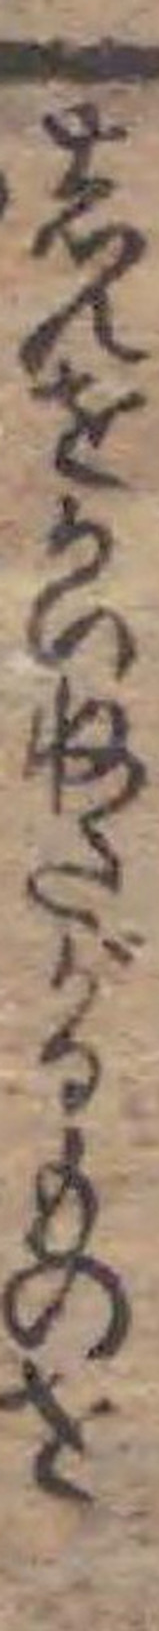しんをかいねたがるものを
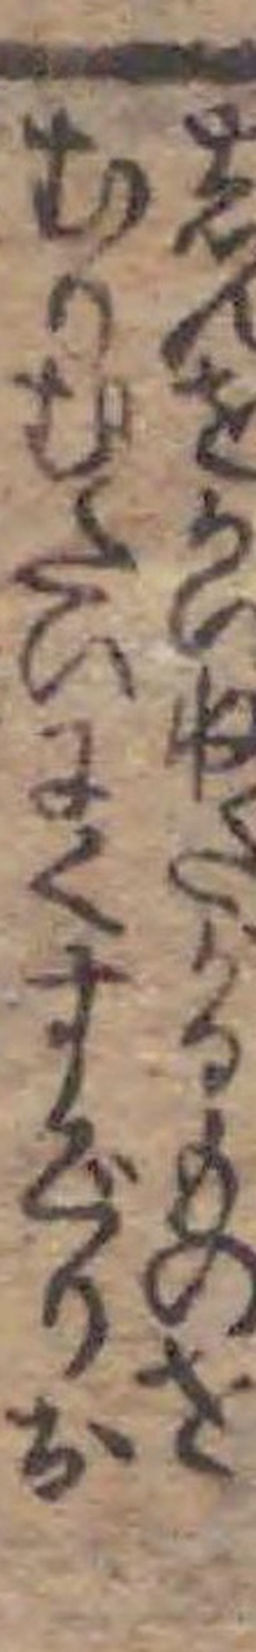むりむたいにくすぐりお
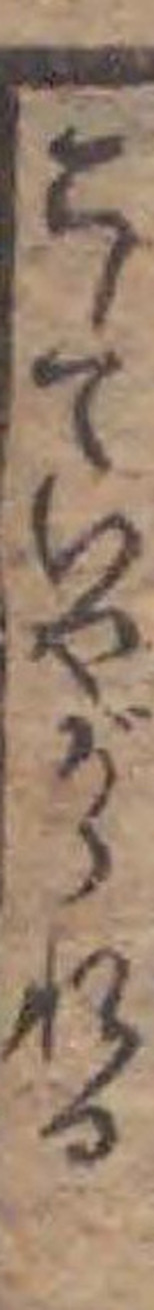こしていやがられる
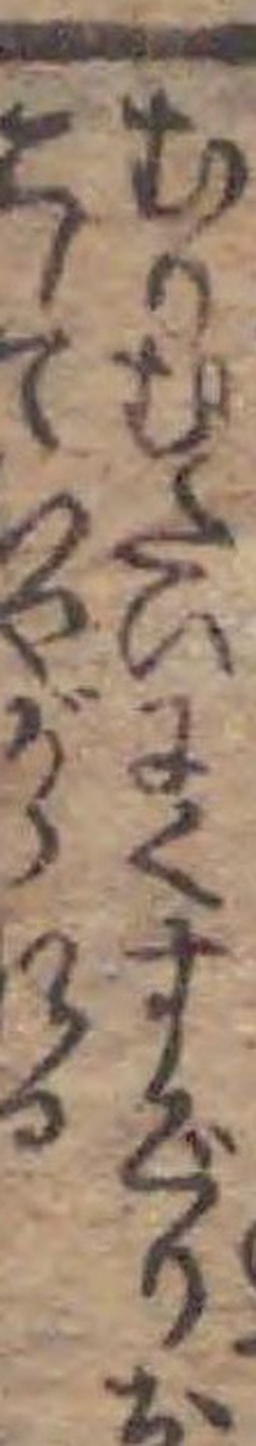こしていやがられる

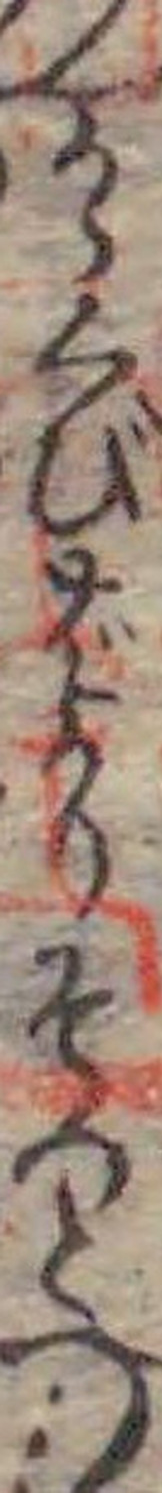のとからくびばかりそつと
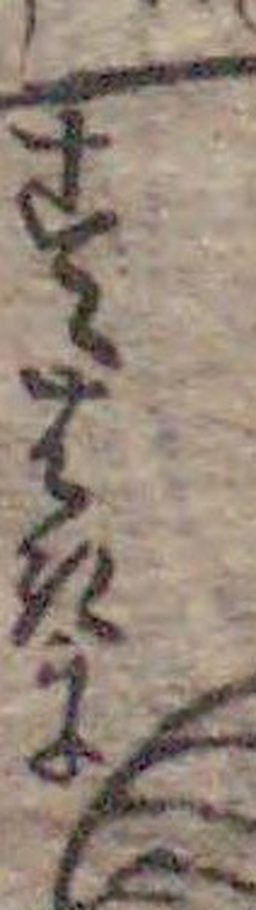すゝはきに
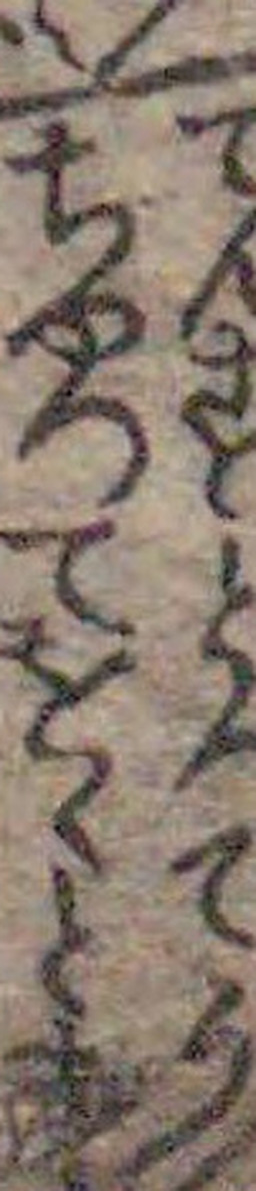ちやつてをくとまた
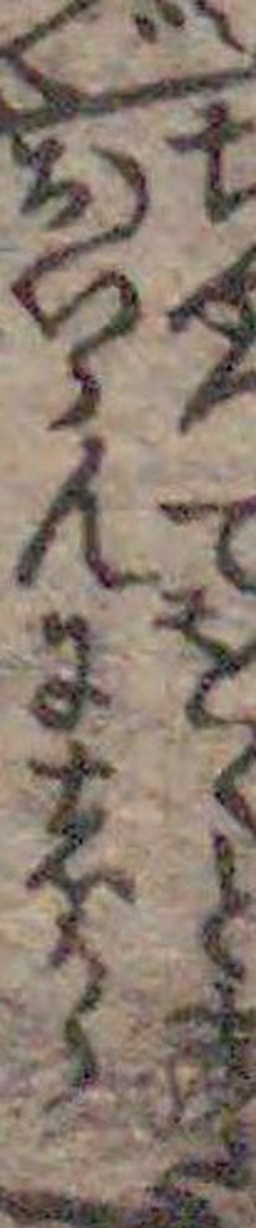おいらんにしから
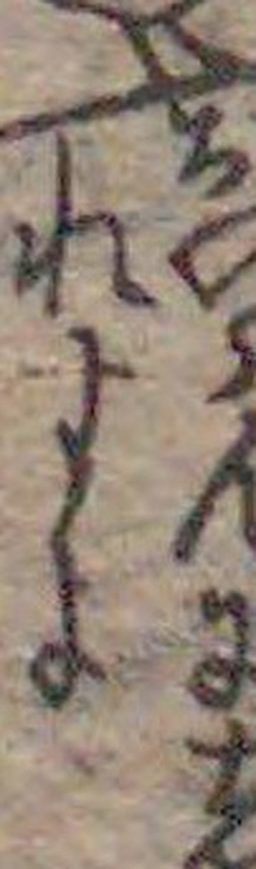れすよ
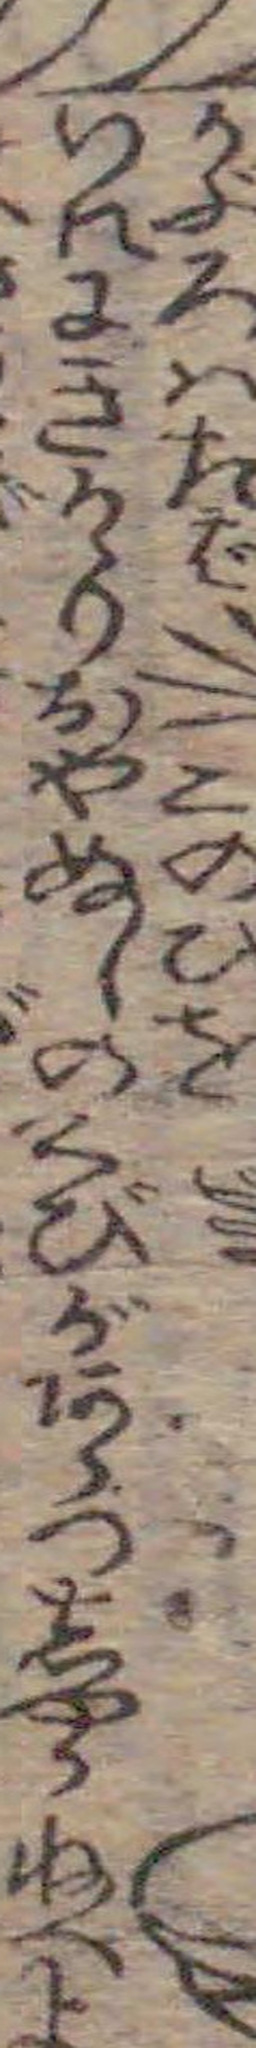いけにきかゝりおやぬしおくびがあらつしやらねへよと
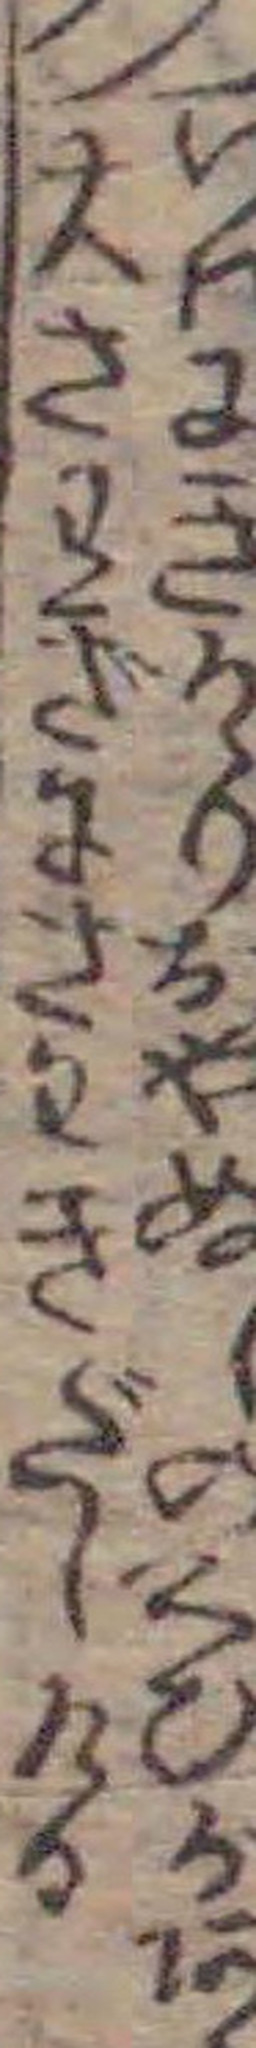大さわぎにさわきだしける
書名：化物楽屋異牒 : 2巻
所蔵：国立国会図書館 National Diet Library, JAPAN
